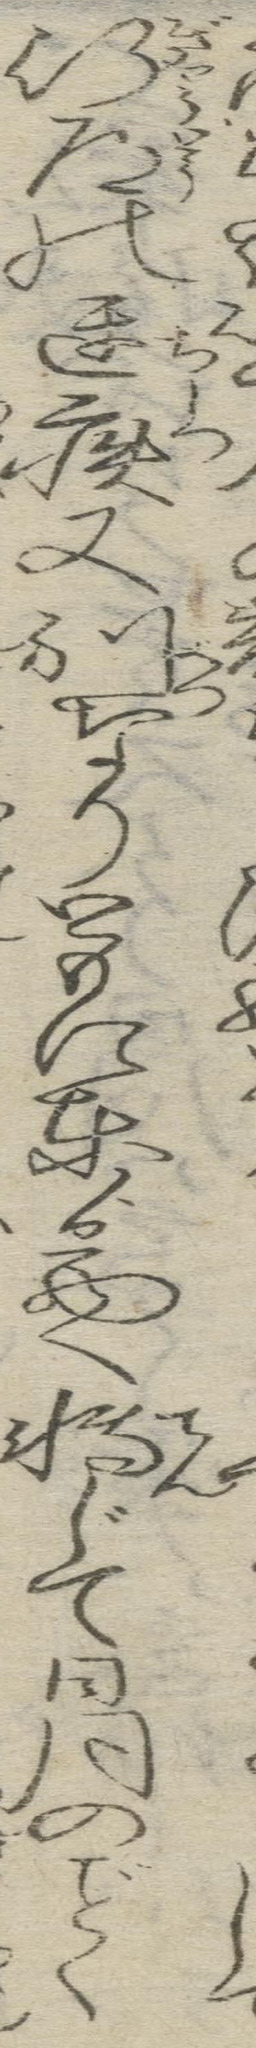行道の遅疾又別なりともに東ゟ西へ転じて日月のごとく
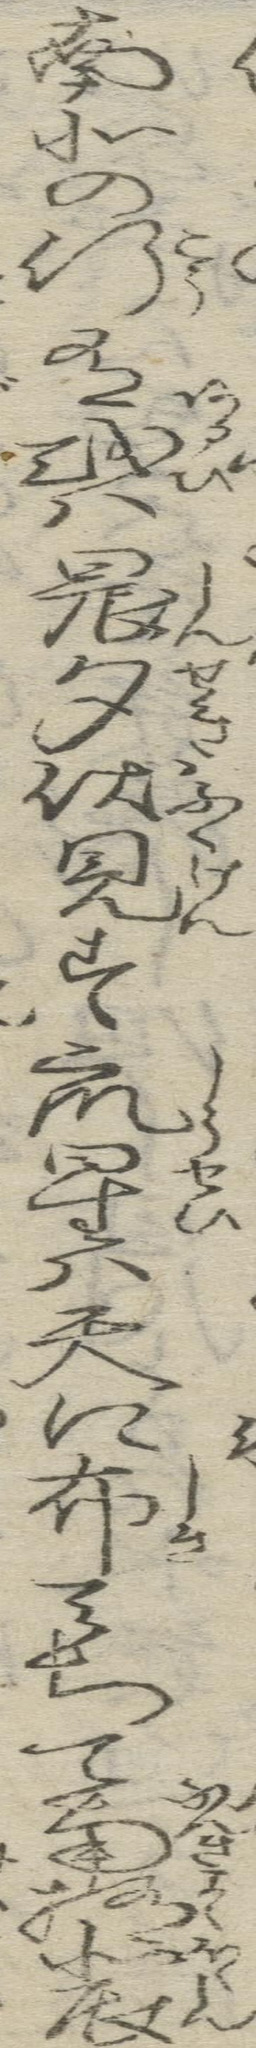南北の行有或は晨夕伏見す衆星は天に布みちて南極北辰
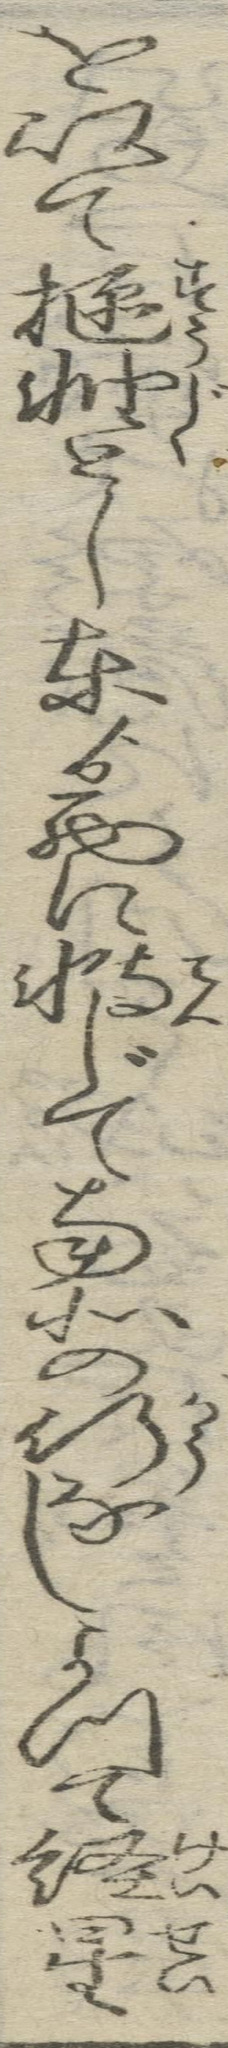を以て枢軸とし東ゟ西に転じて南北の行なしよつて経星
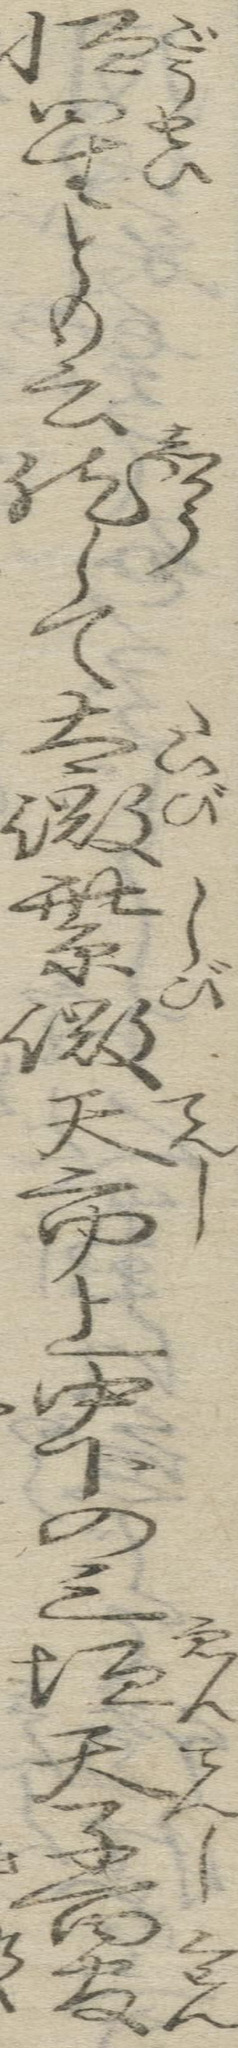恒星とも云然して太微紫微天市上中下の三垣天子百官
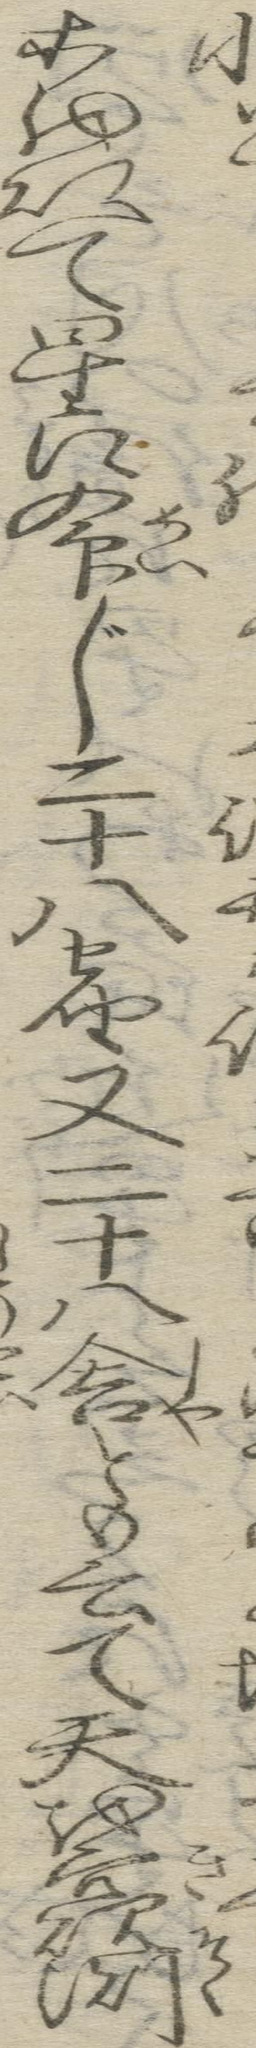等を以て星に命じ二十八宿又二十八舎とも云て天を窺測
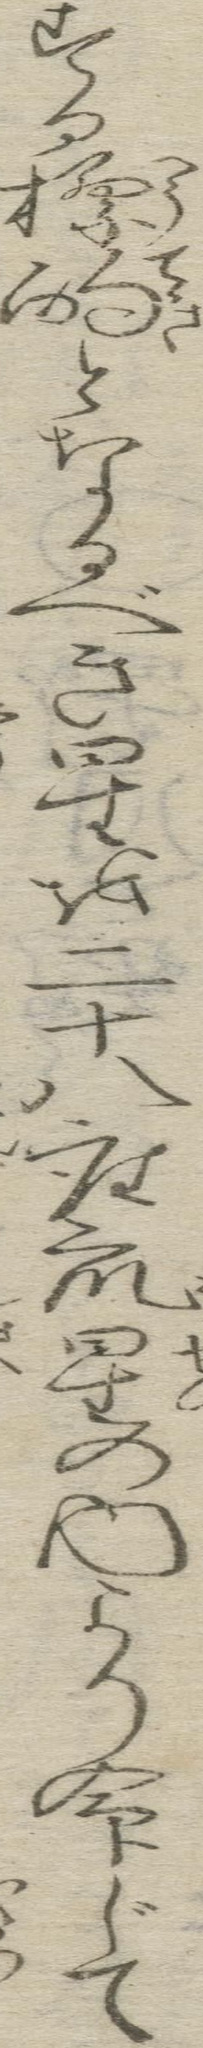する標的となるべき星を二十八座衆星の内より命じて
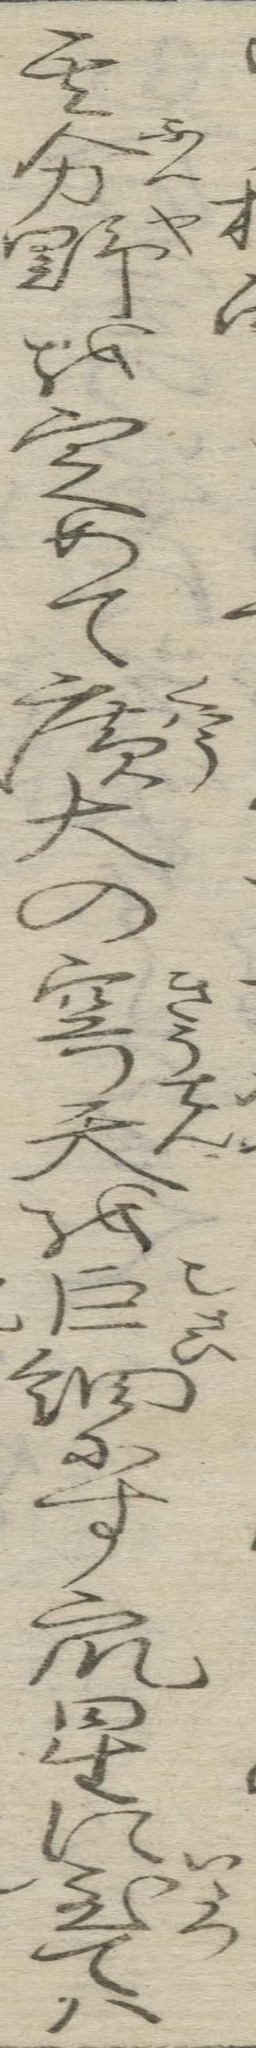其分野を定めて広大の穹天を巨細にす衆星に至ては
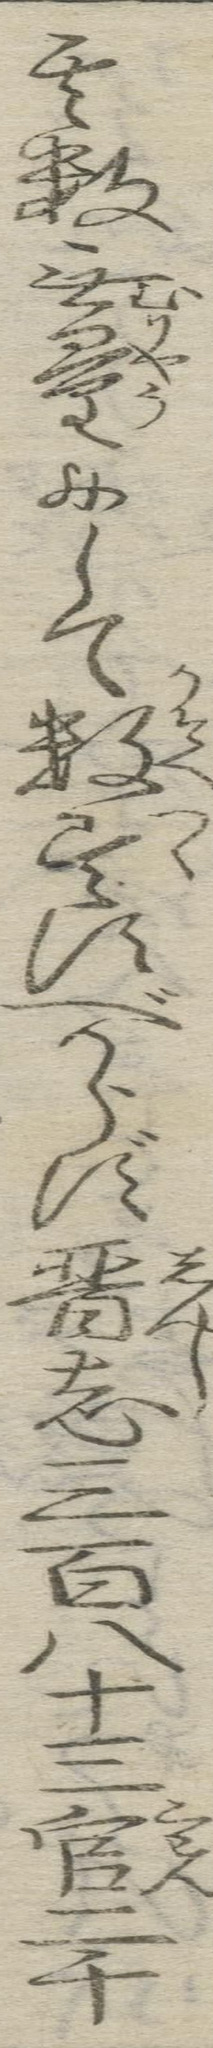其数無量にして数尽すべからず晋志三百八十三官二千
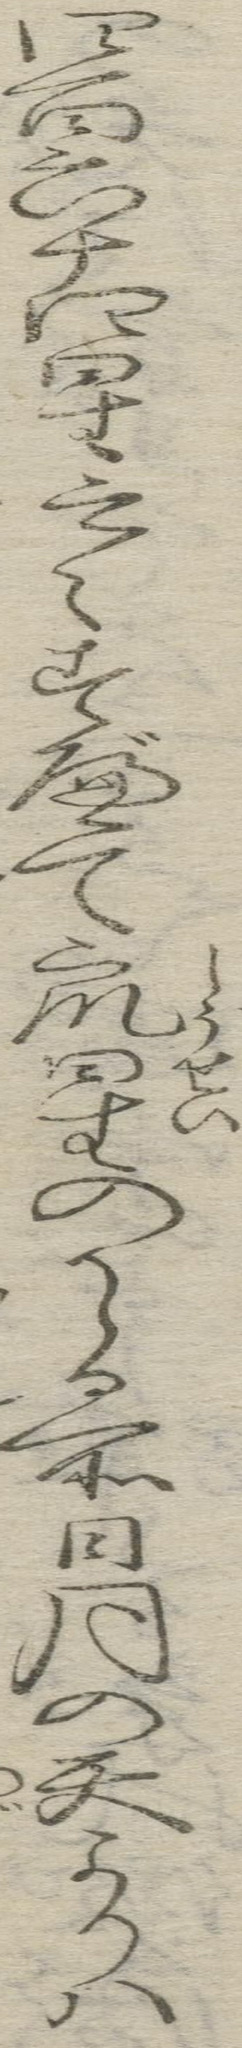四百六十四星云々すべて衆星のかゝる所日月の天よりは
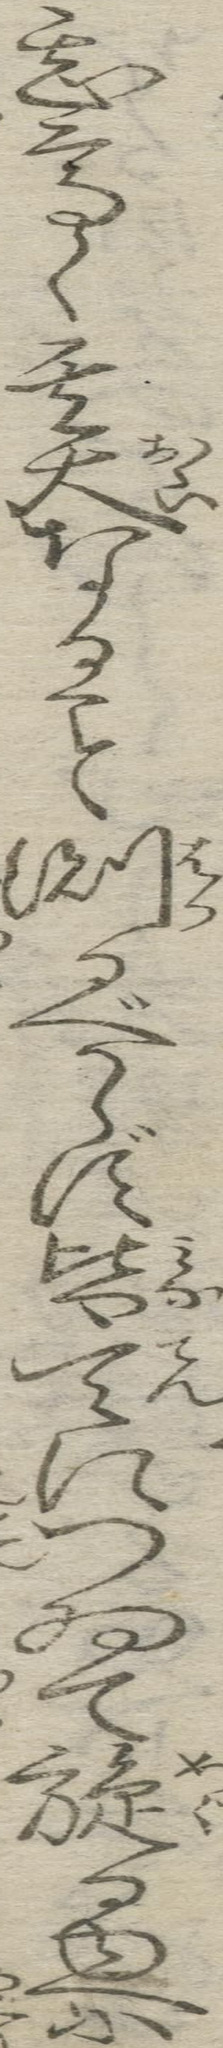甚高く其大なること測るべからず皆天につゐて旋るゆへに
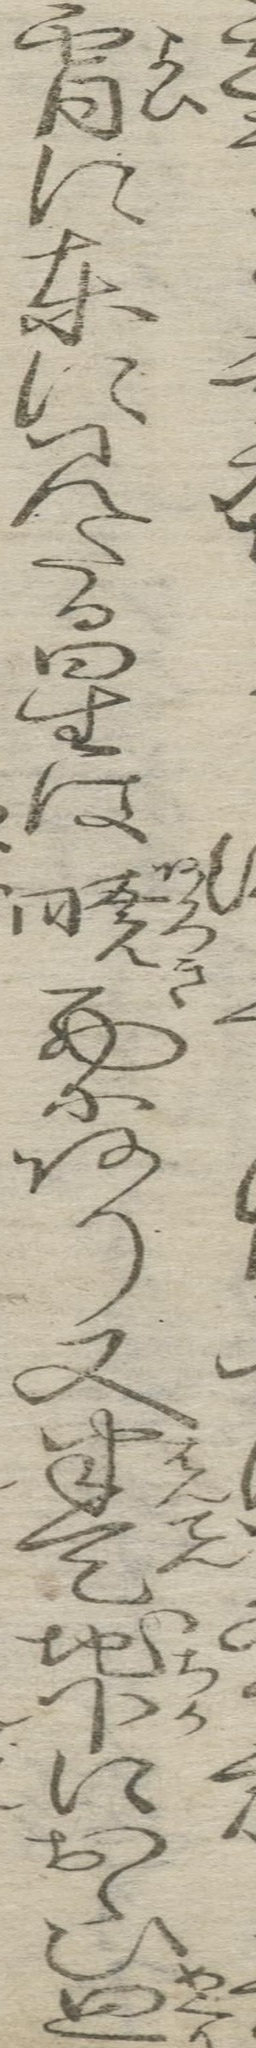宵に東に見たる星は暁西にあり又半天地下におゝひ廻
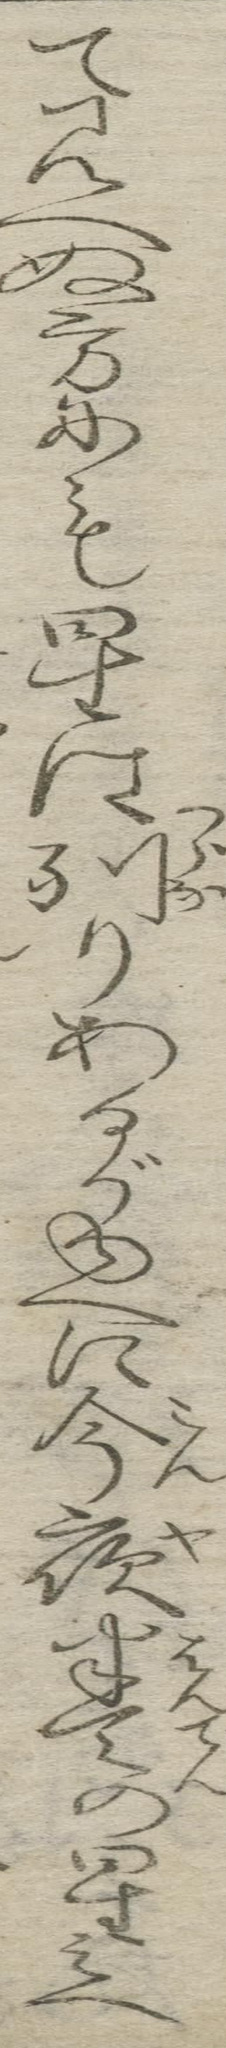て見へぬ方にも星は列りあるがゆへに今夜半天の星みへ
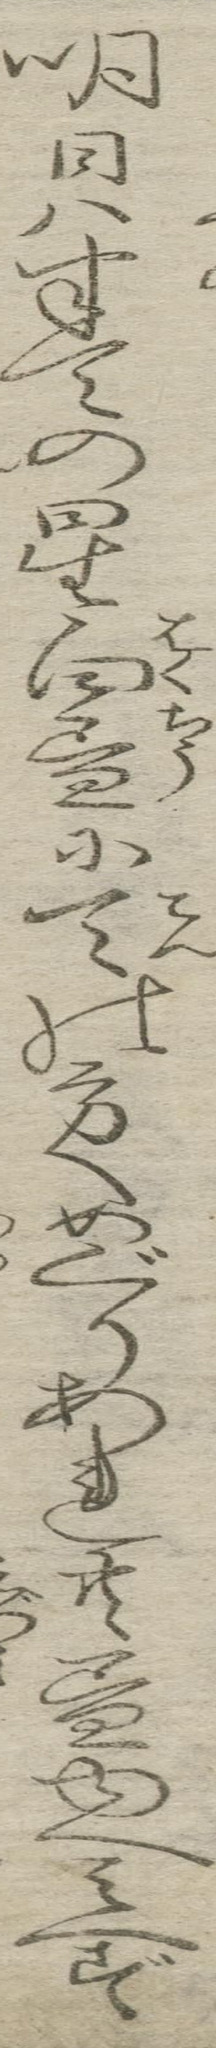明日は半天の星白昼に天の方へめぐり沈てみへざる有
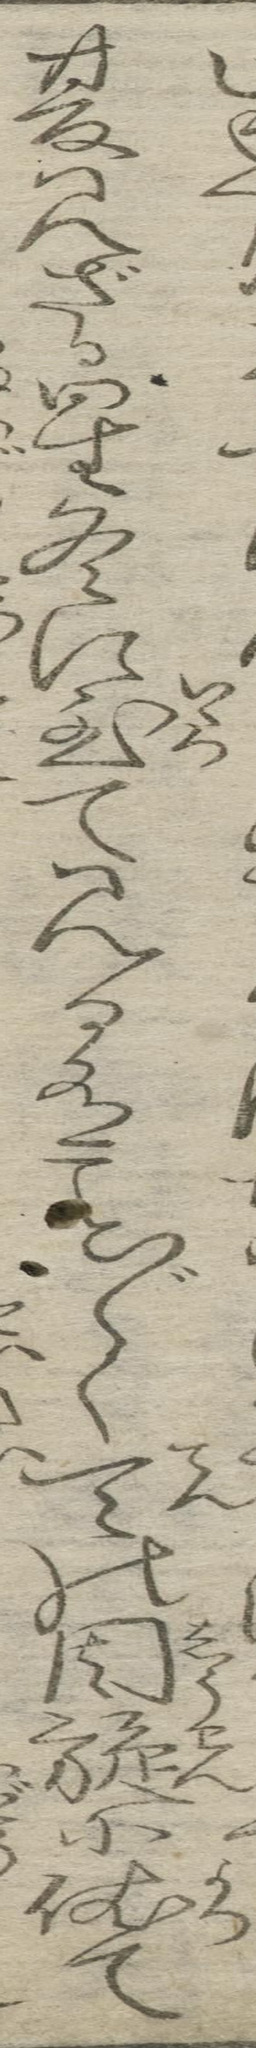夏見ざる星冬に至て見る有こと〴〵く天の周旋に依て
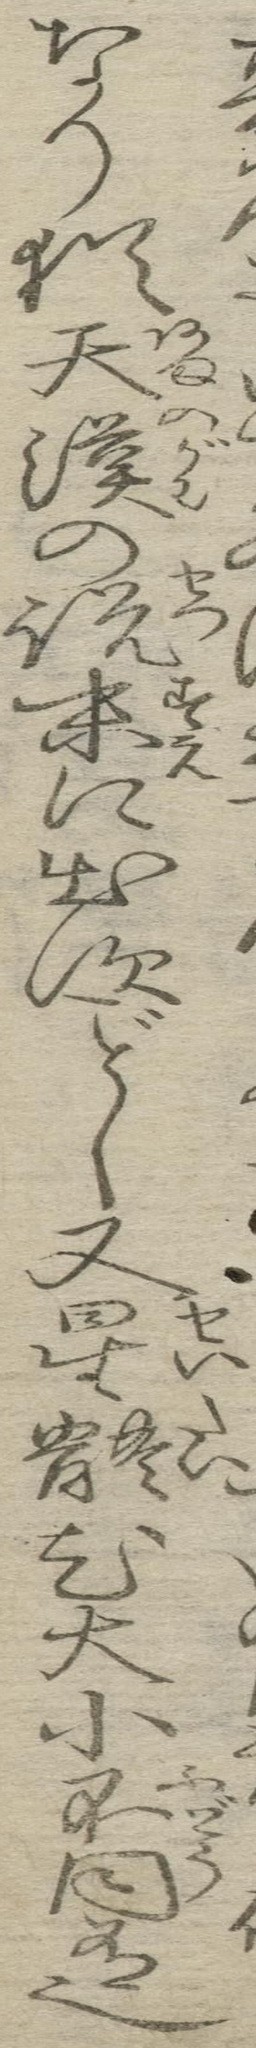なり猶天漢の説末に出すごとく又星体尤大小不同有也

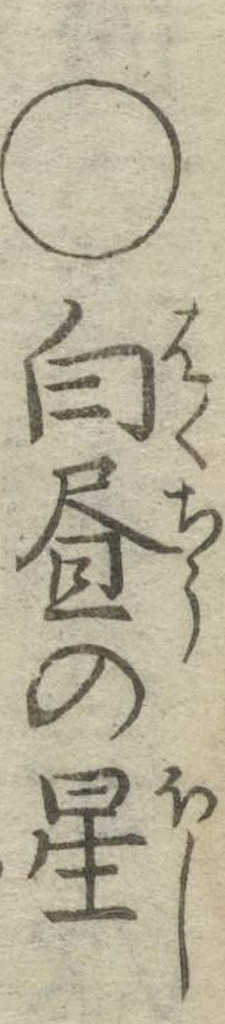○白昼の星
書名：訓蒙天地辨　天
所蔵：東京大学地震研究所図書室 Earthquake Research Institute Library, The University of Tokyo, JAPAN
